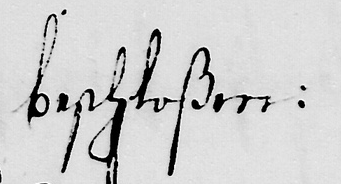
beschloßen:
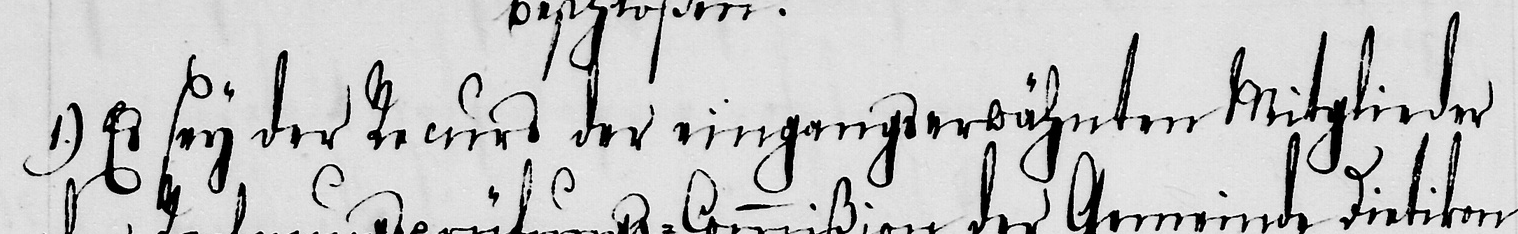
1.) Es sey der Recurs der eingangserwähnten Mitglieder
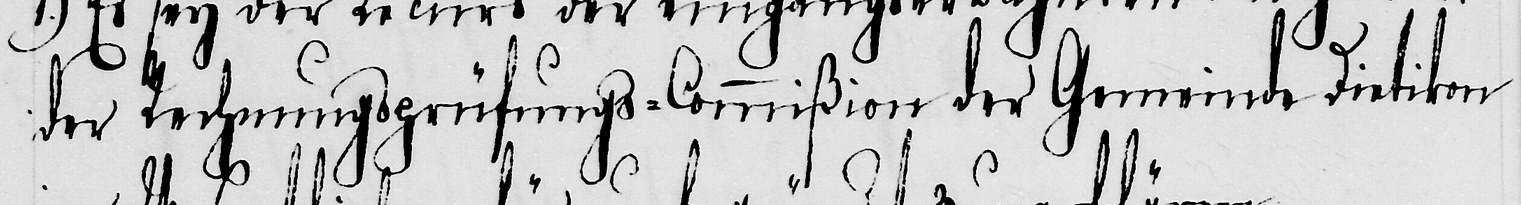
der Rechnungsprüfungs-Commißion der Gemeinde Dietikon
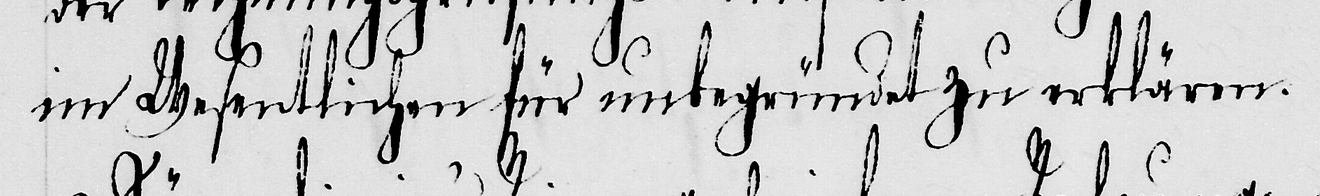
im Wesentlichen für unbegründet zu erklären.
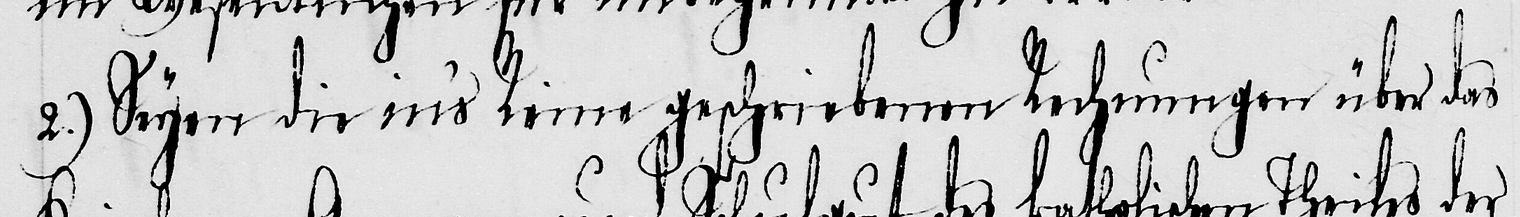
2.) Seyen die ins Reine geschriebenen Rechnungen über das
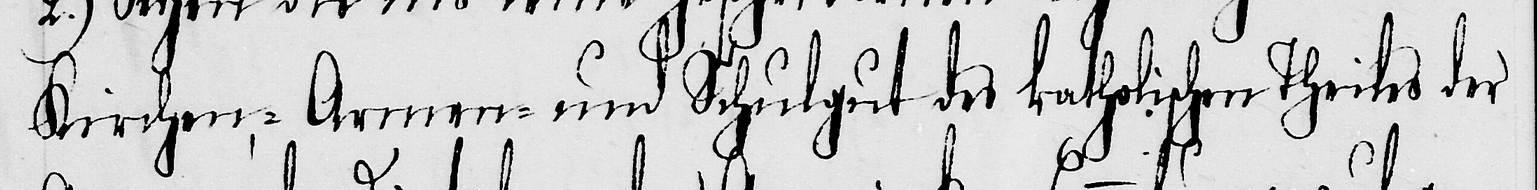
Kirchen-, Armen- und Schulgut des katholischen Theiles der
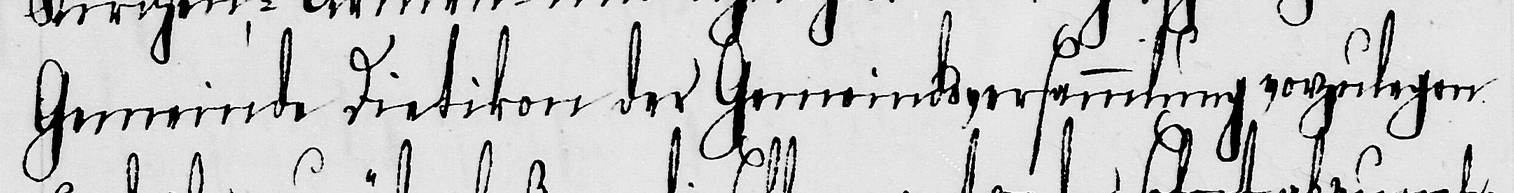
Gemeinde Dietikon der Gemeindsversammlung vorzulegen
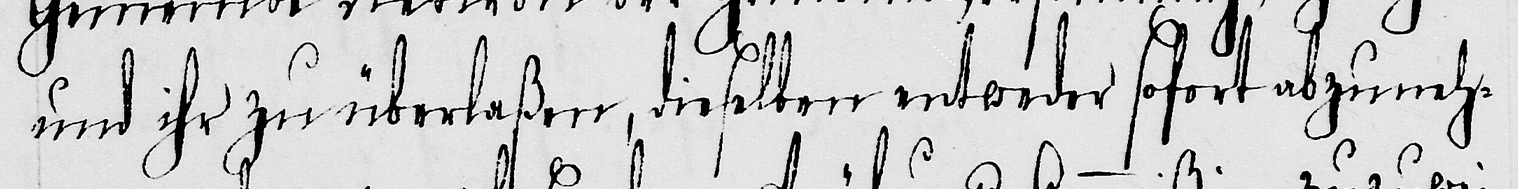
und ihr zu überlaßen, dieselben entweder sofort abzuneh¬
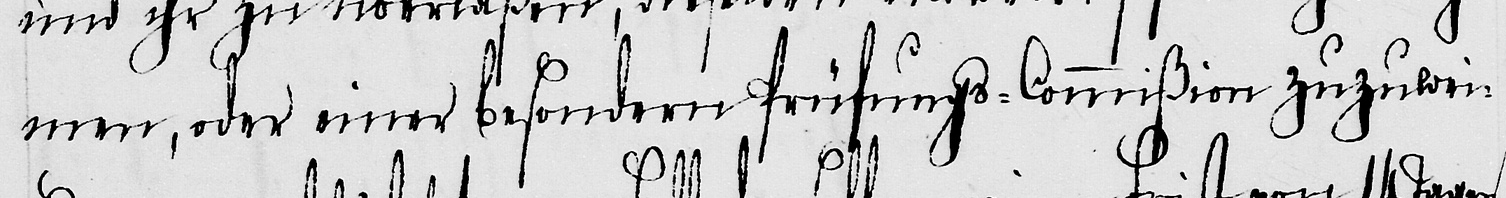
men, oder einer besondern Prüfungs-Commißion zuzuwei¬
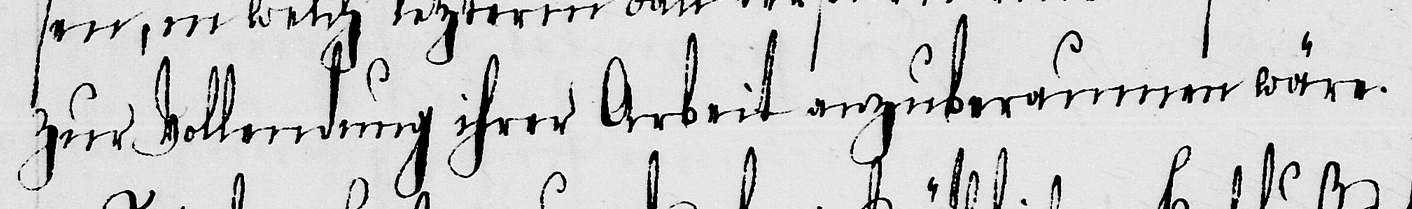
zur Vollendung ihrer Arbeit anzuberaumen wäre.
